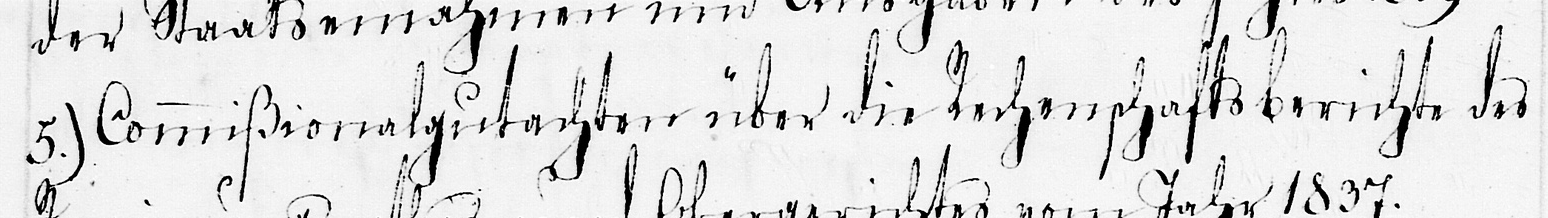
5.) Commißionalgutachten über die Rechenschaftsberichte des
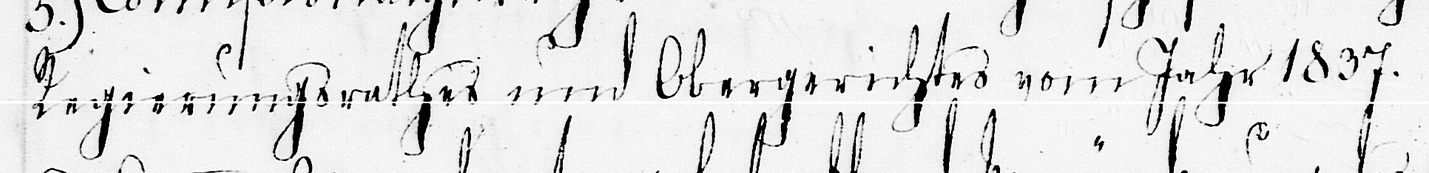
Regierungsrathes und Obergerichtes vom Jahr 1837.
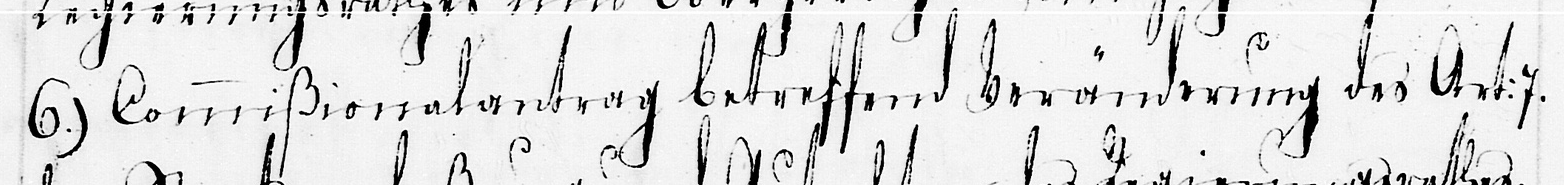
6.) Commißionalantrag betreffend Veränderung des Art:
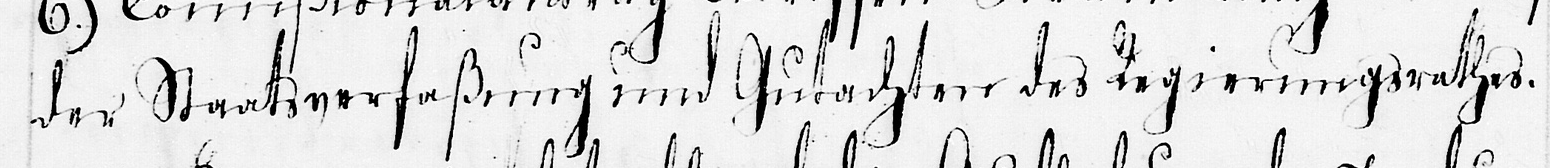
der Staatsverfaßung und Gutachten des Regierungsrathes.
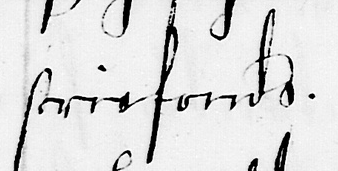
striefonds.
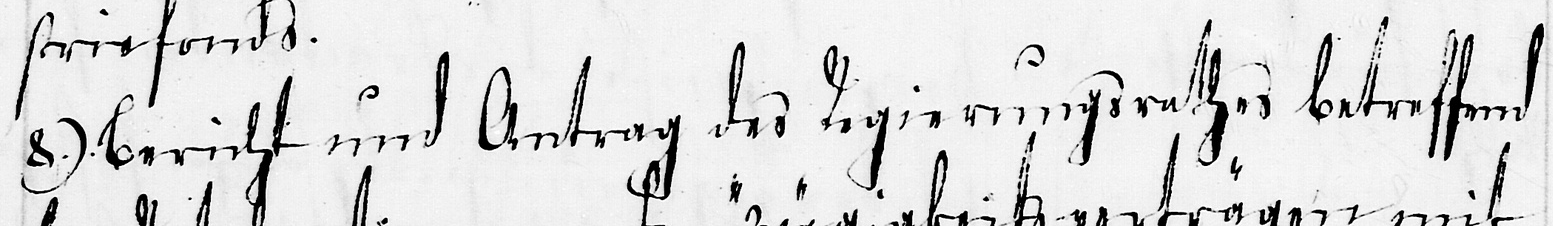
8.) Bericht und Antrag des Regierungsrathes betreffend
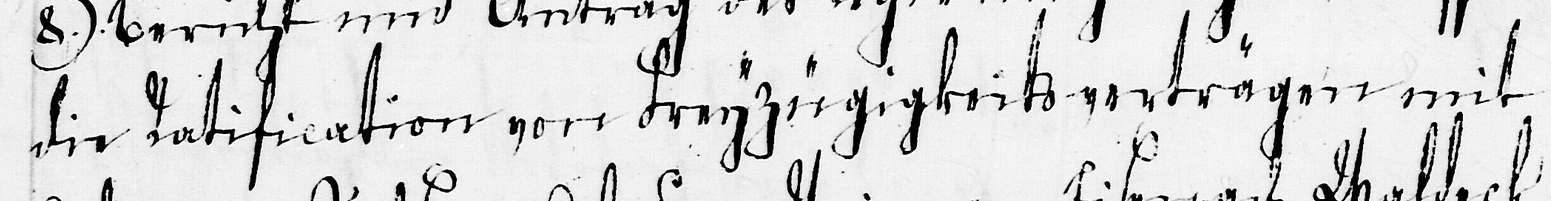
die Ratification von Freyzügigkeitsverträgen mit
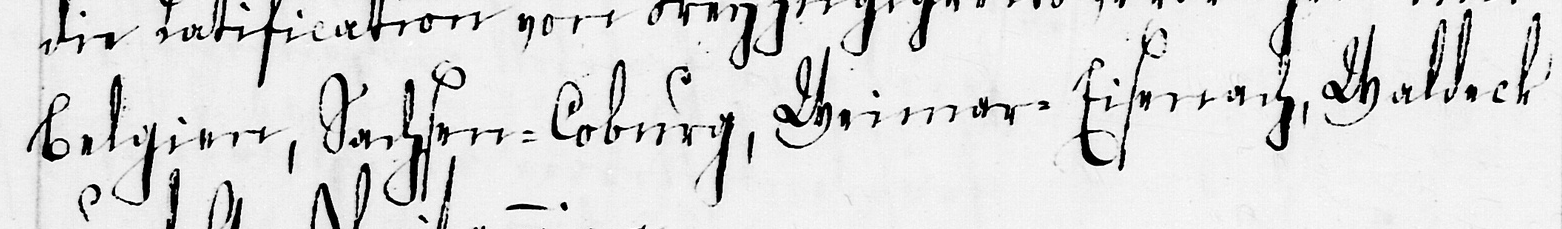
Belgien, Sachsen-Coburg, Weimar-Eisenach, Waldeck
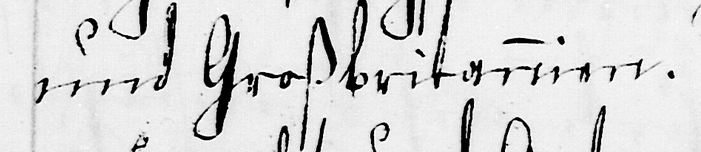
und Großbritannien.
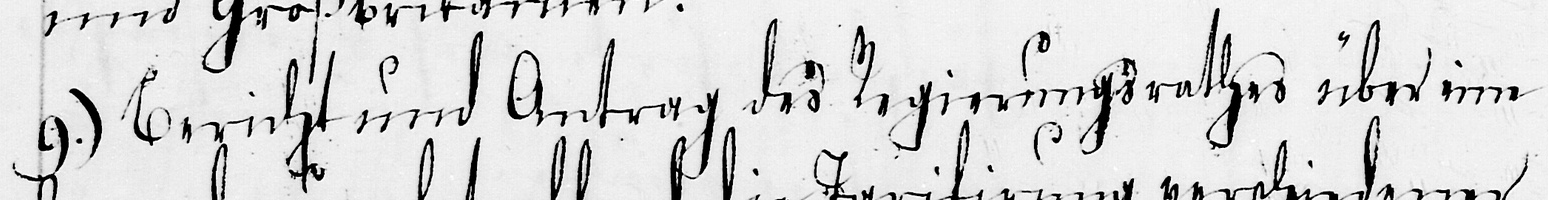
9.) Bericht und Antrag des Regierungsrathes über eine
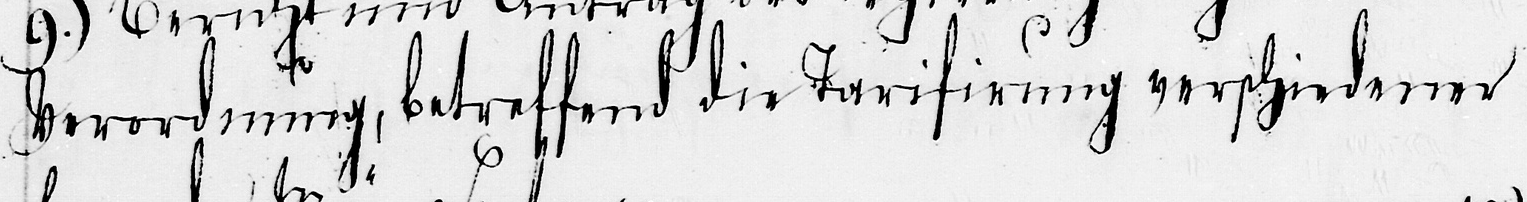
Verordnung, betreffend die Tarifirung verschiedener
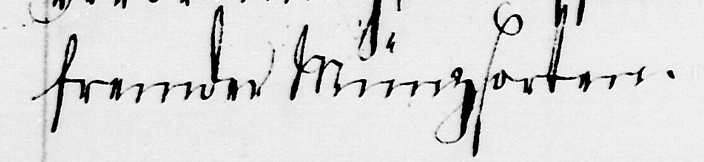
fremder Münzsorten.
